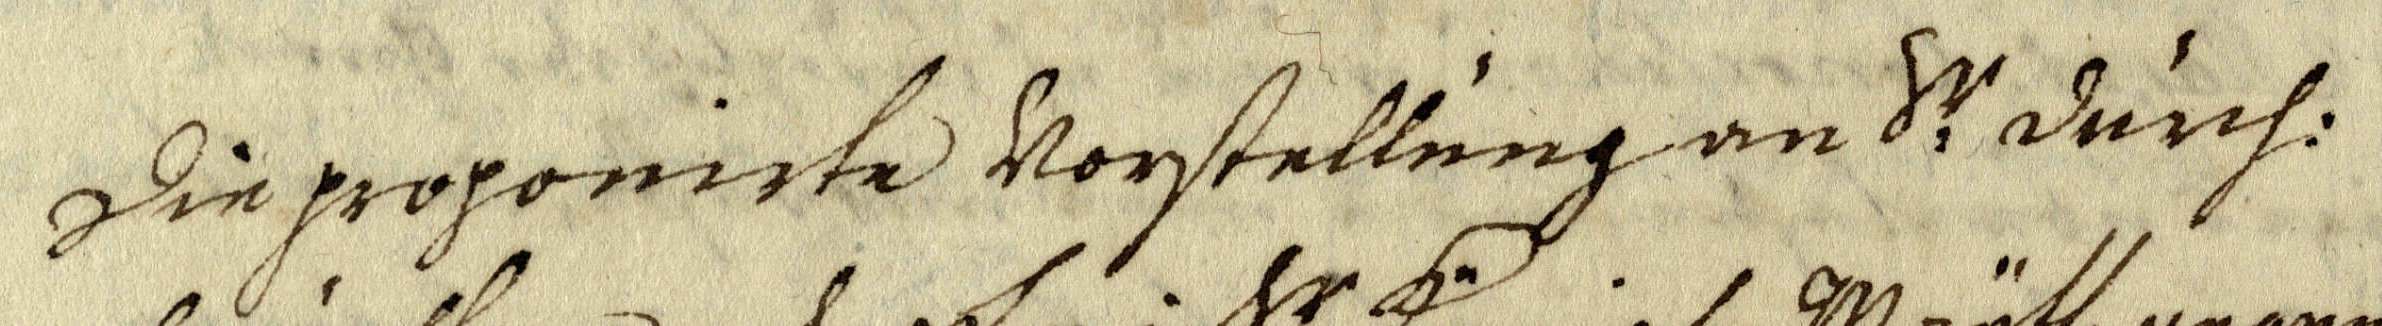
Die proponirte Vorstellung an Sr Durch¬
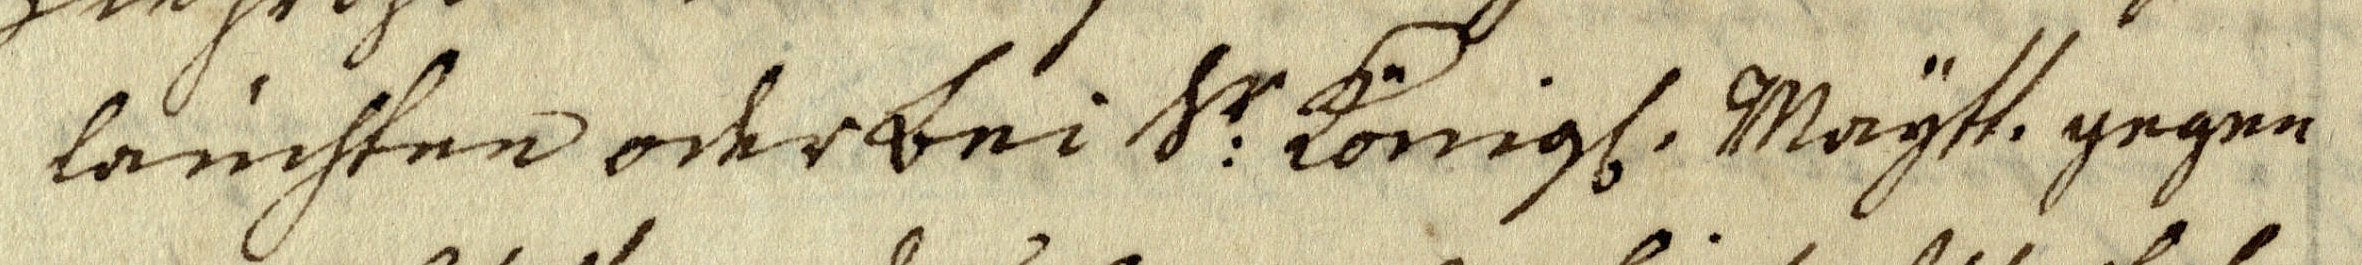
lauchten oder bei Sr. Königl. Maÿtt. gegen
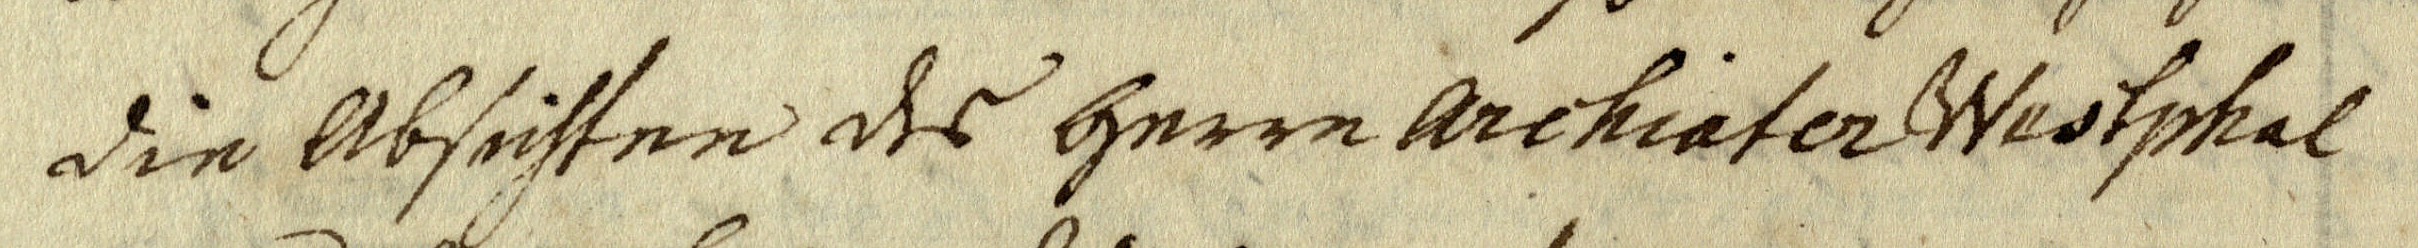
die Absichten des Herrn Archiater Westphal
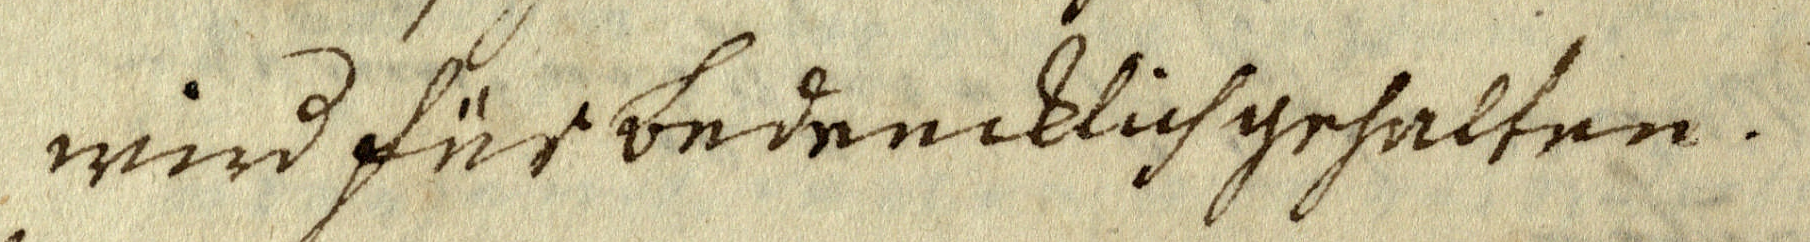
wird für bedencklich gehalten.
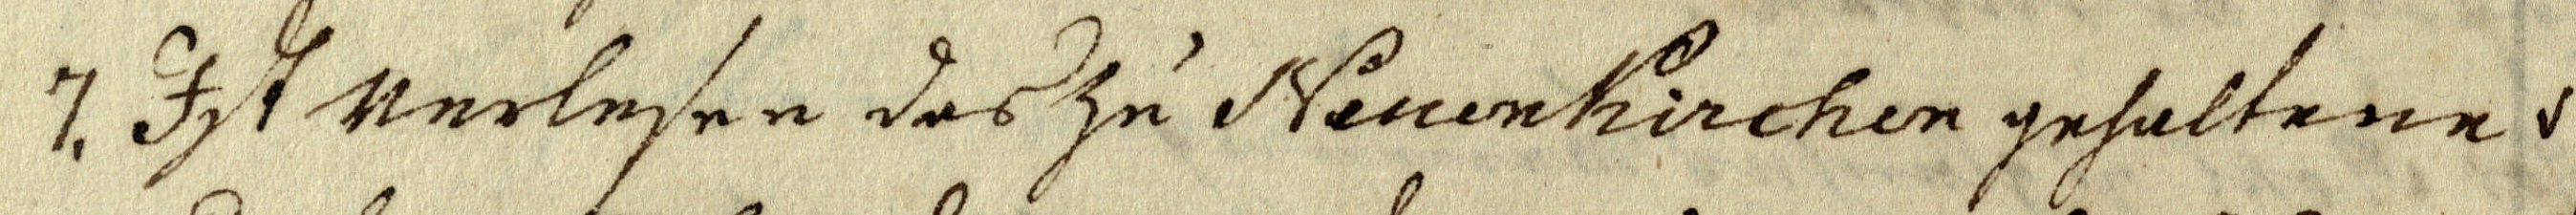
7, Ist verlesen das zu Neuenkirchen gehaltene
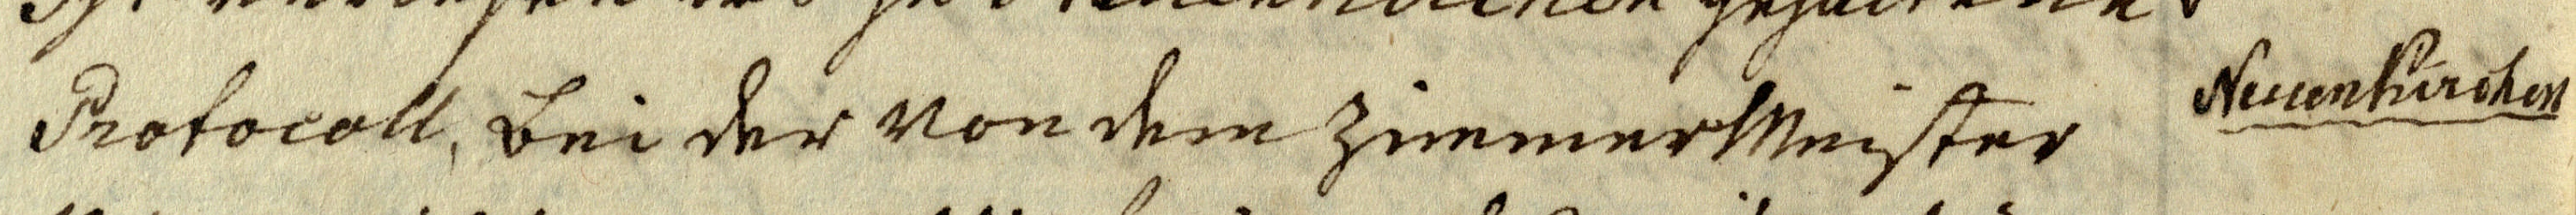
Protocoll bei der von dem Zimmermeister
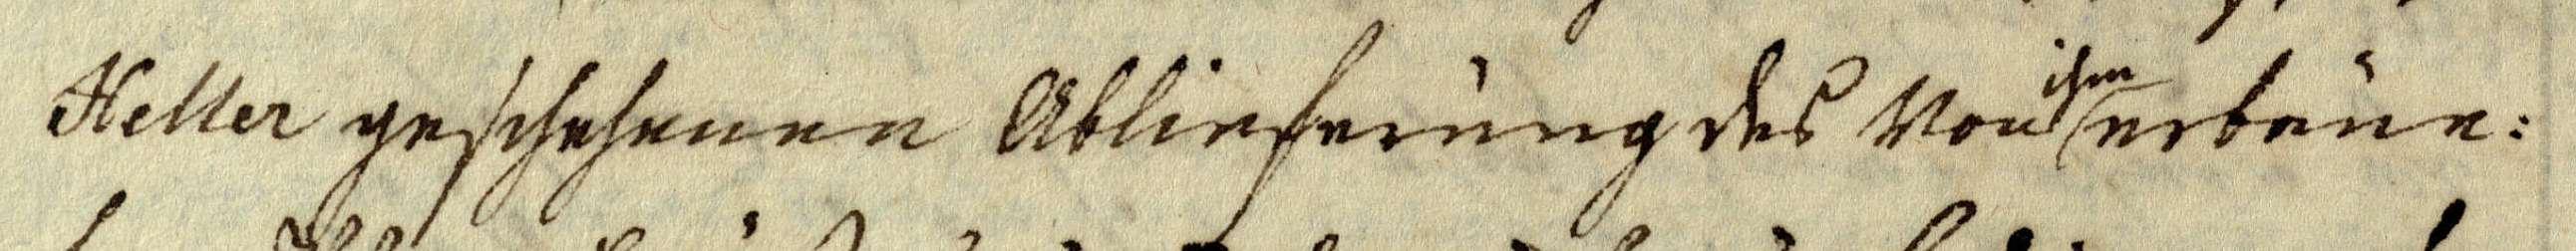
Heller geschehenen Ablieferung des von ihm erbaue¬
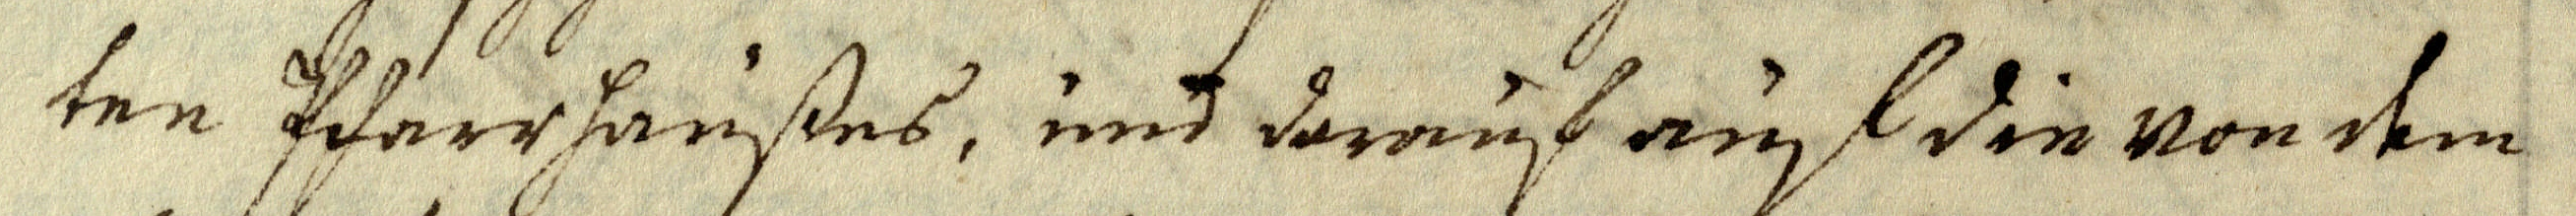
ten Pfarrhauses , und darauf auf die von dem
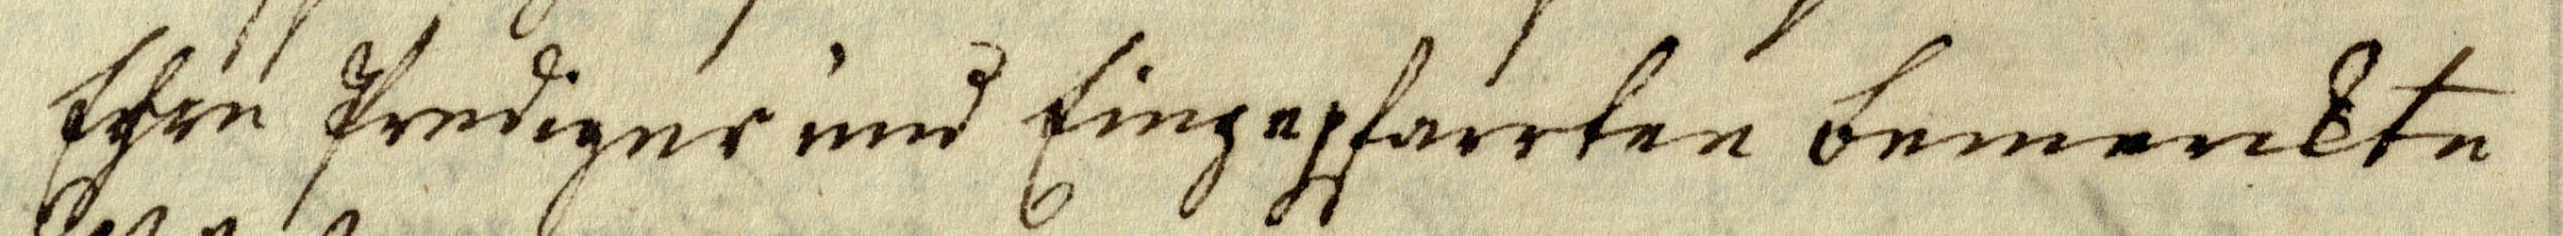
Ehre Prediger und Eingepfarrten bemerckte
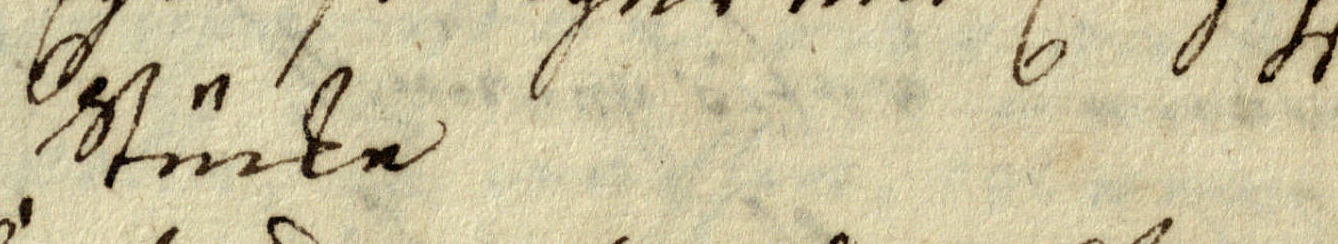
Stücke.
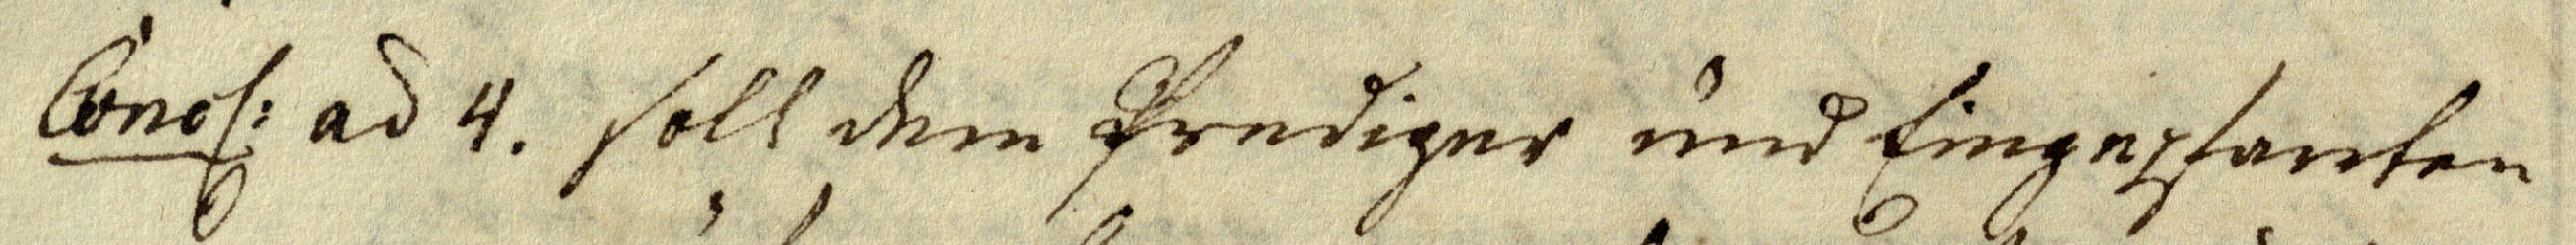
Concl. ad 4. soll dem Prediger und Eingepfarrten
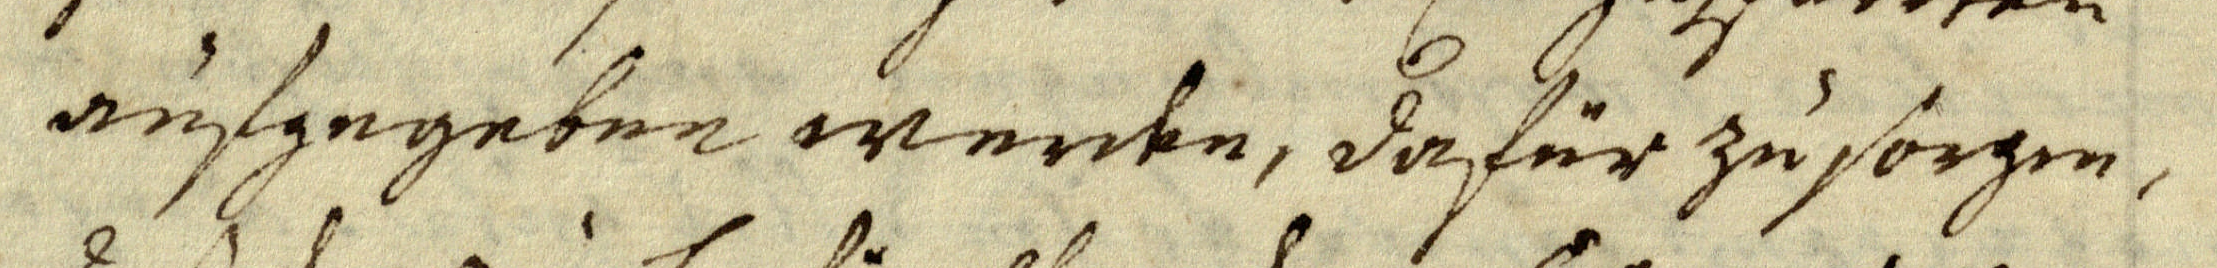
aufgegeben werden, dafür zu sorgen,
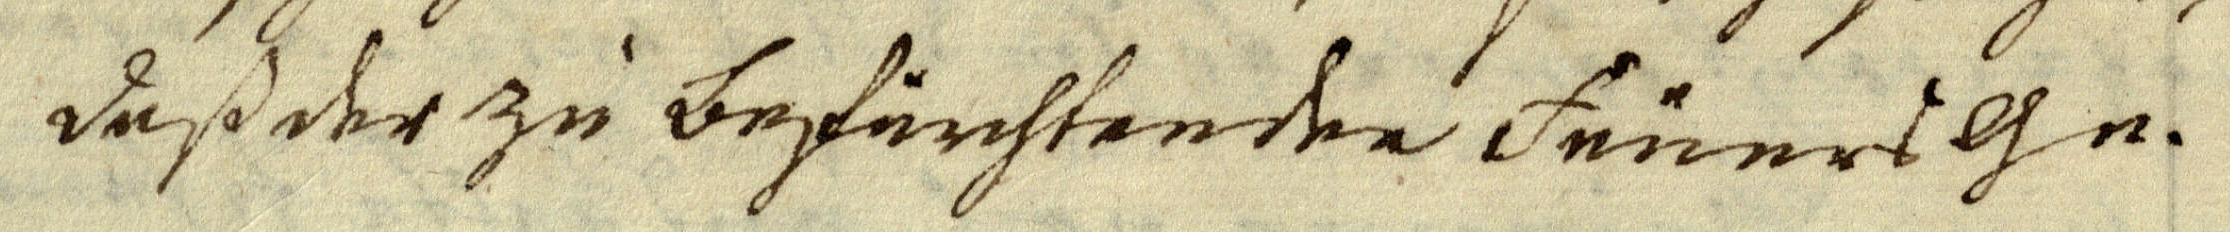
daß der zu befürchteten Feuersge¬
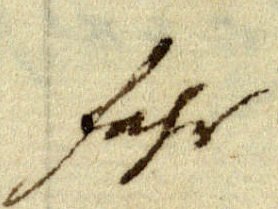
fahr
